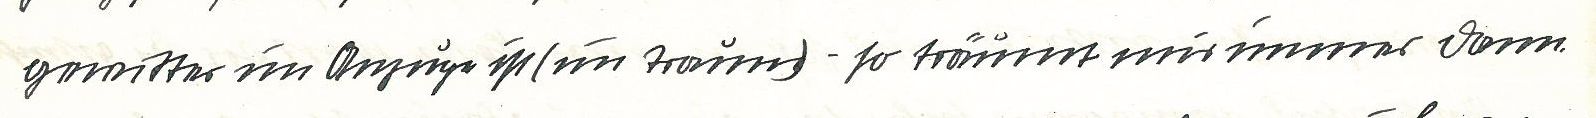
gewitter im Anzuge ist (im Traum) – so träumt mir immer dann.
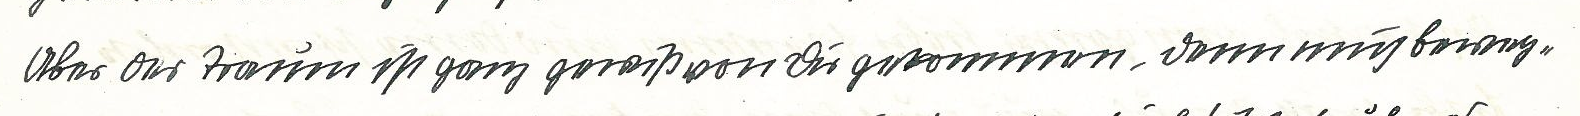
Aber der Traum ist ganz gewiß von Dir gekommen, denn mich beweg¬
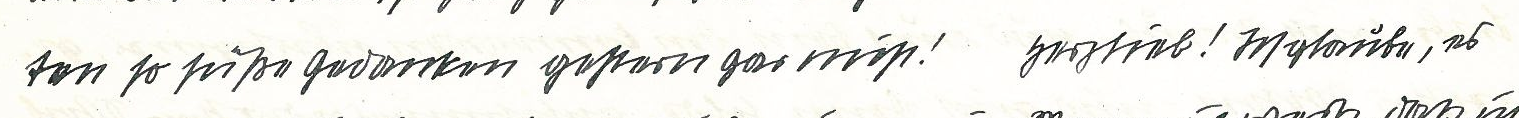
ten so süße Gedanken gestern gar nicht! Herzlieb! Ich glaube, es
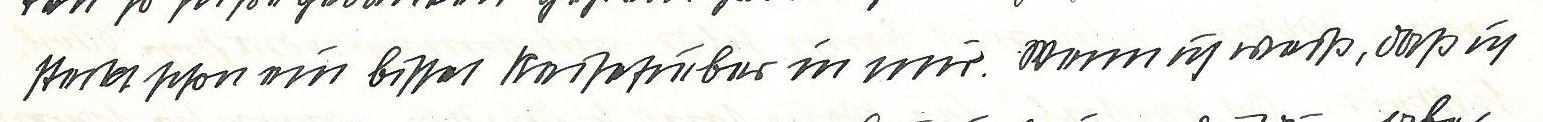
steckt schon ein bissel Reisefieber in mir. Wenn ich weiß, daß ich
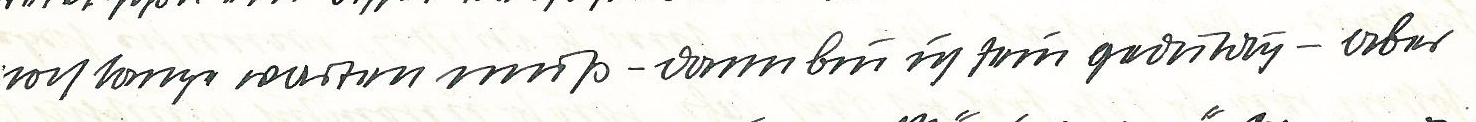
och lange warten muß – dann bin ich fein geduldig – aber
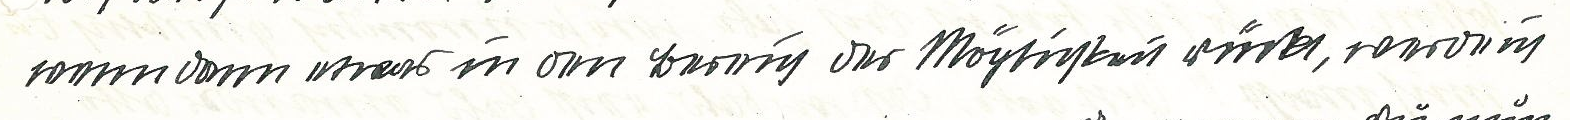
wenn dann etwas in den Bereich der Möglichkeit rückt, werde ich
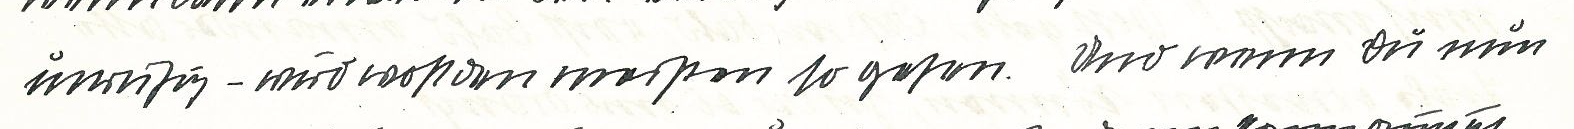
unruhig – wird wohl den meisten so gehen. Und wenn Du nun
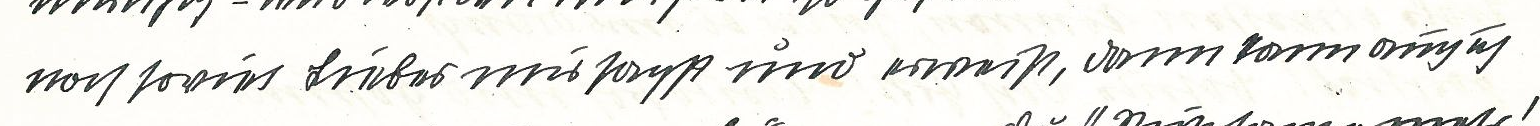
noch so viel Liebes mir sagst und erweist, dann kann auch ich
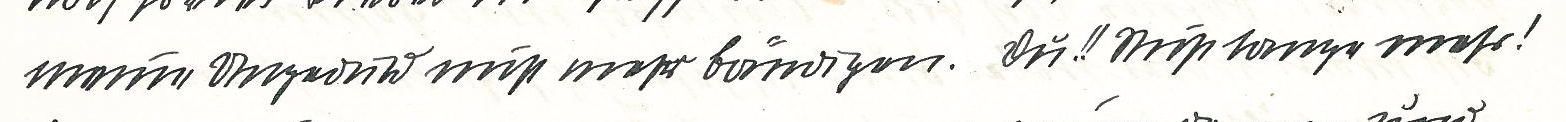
meine Ungeduld nicht mehr bändigen. Du!! Nicht lange mehr!
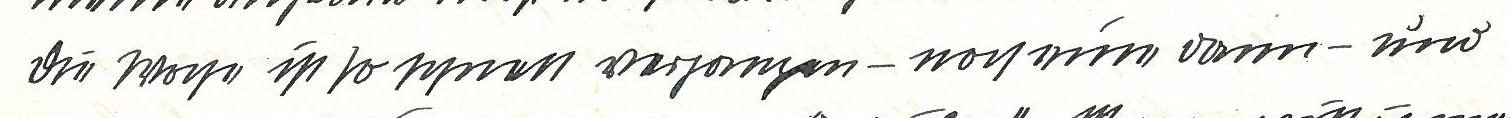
Die Woche ist so schnell vergangen – noch eine dann – und
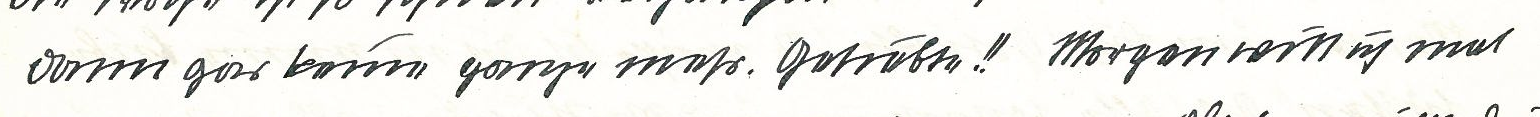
dann gar keine ganze mehr. Geliebte!! Morgen will ich mal
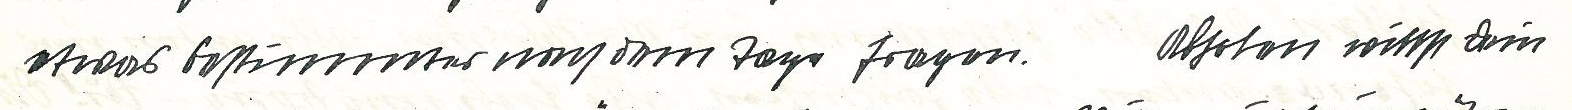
etwas bestimmter nach dem Tage fragen. Abholen willst Dein
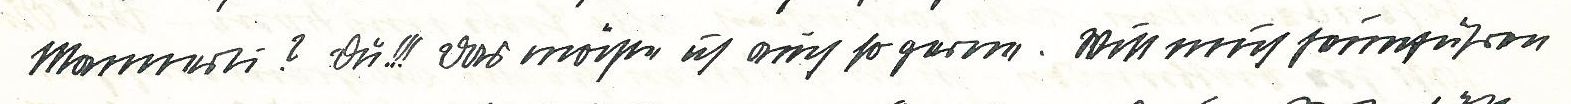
Mannerli? Du!!! Das möchte ich auch so gerne. Will mich heimführen
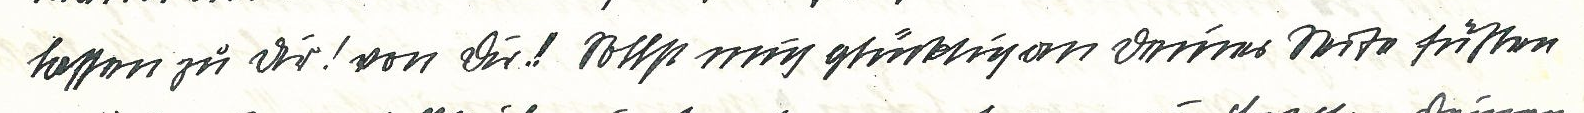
lassen zu Dir! von Dir!! Sollst mich glücklich an Deiner Seite fühlen
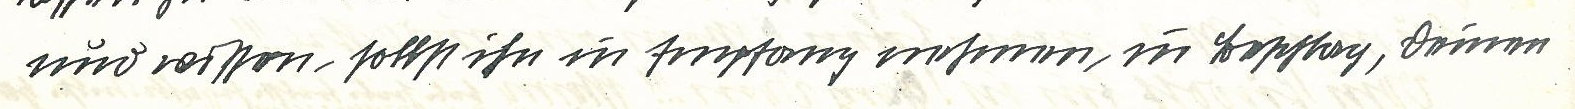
und wissen, sollst ihn in Empfang nehmen, in Beschlag, Deinen
